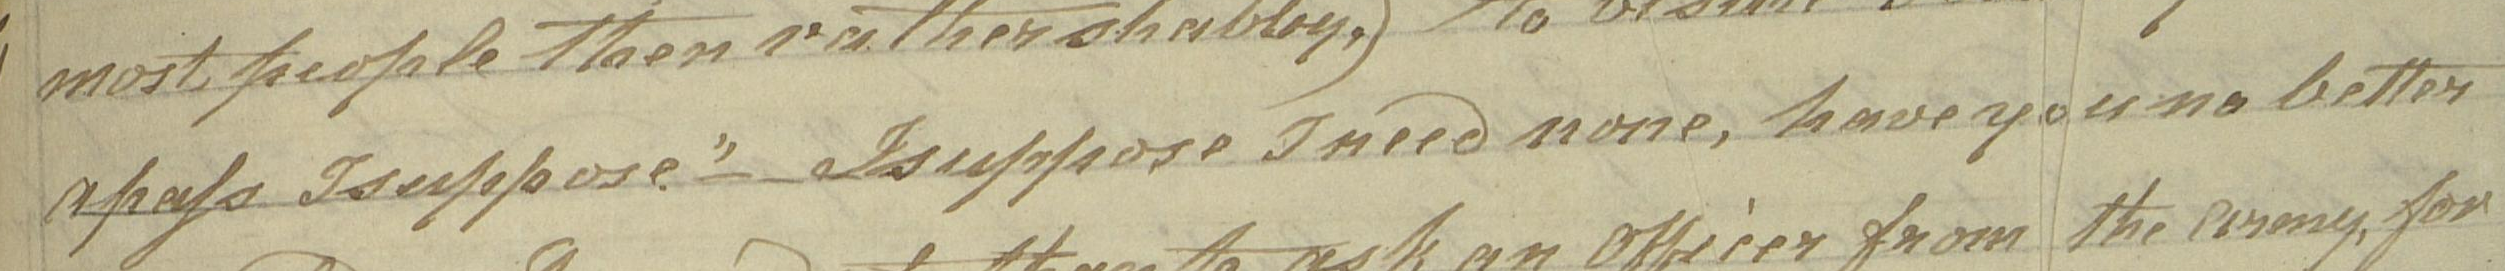a pass I suppose" I suppose I need none, have you no better
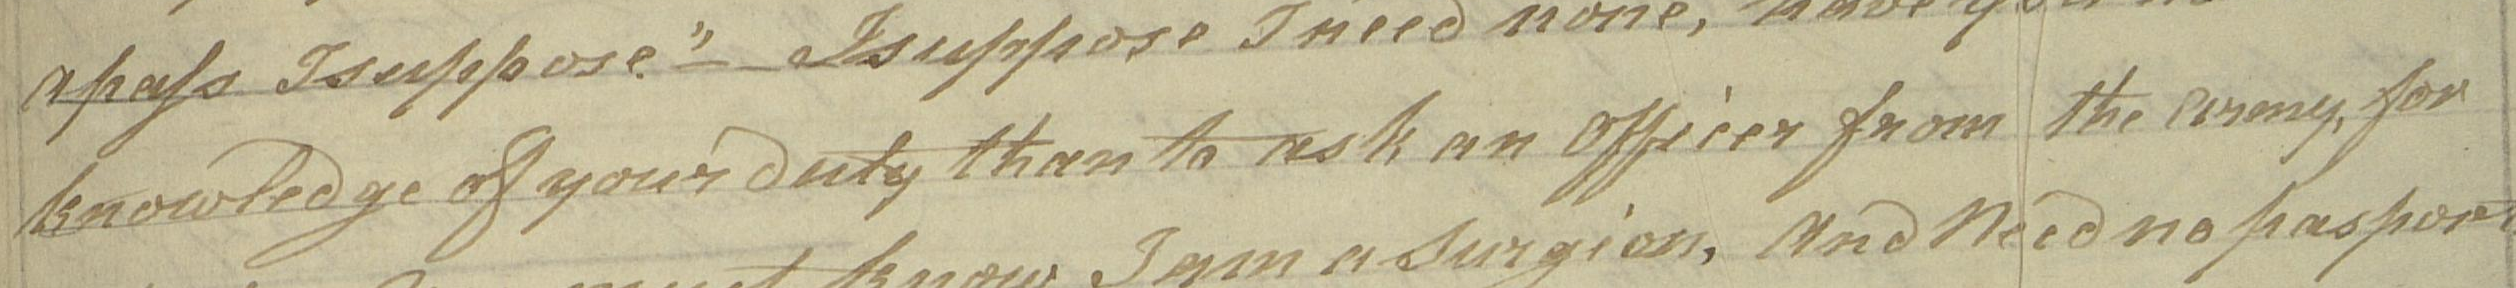knowledge of your duty than to ask an Officer from the army, for
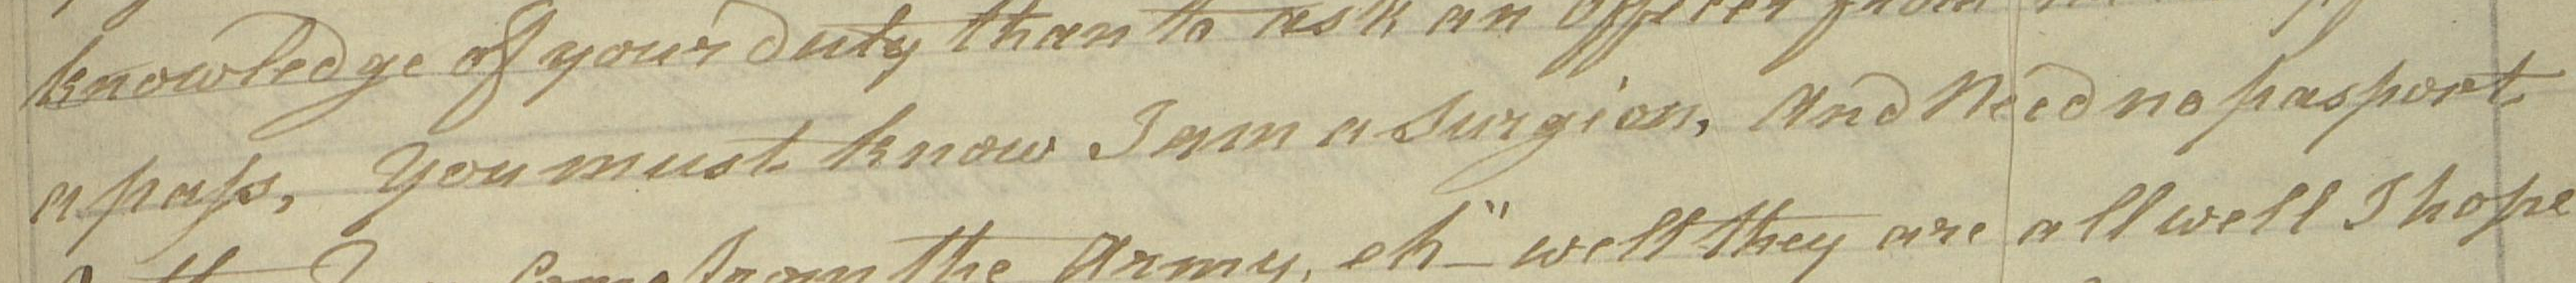a pass. You must know I am as Surgion, And Need no pasport
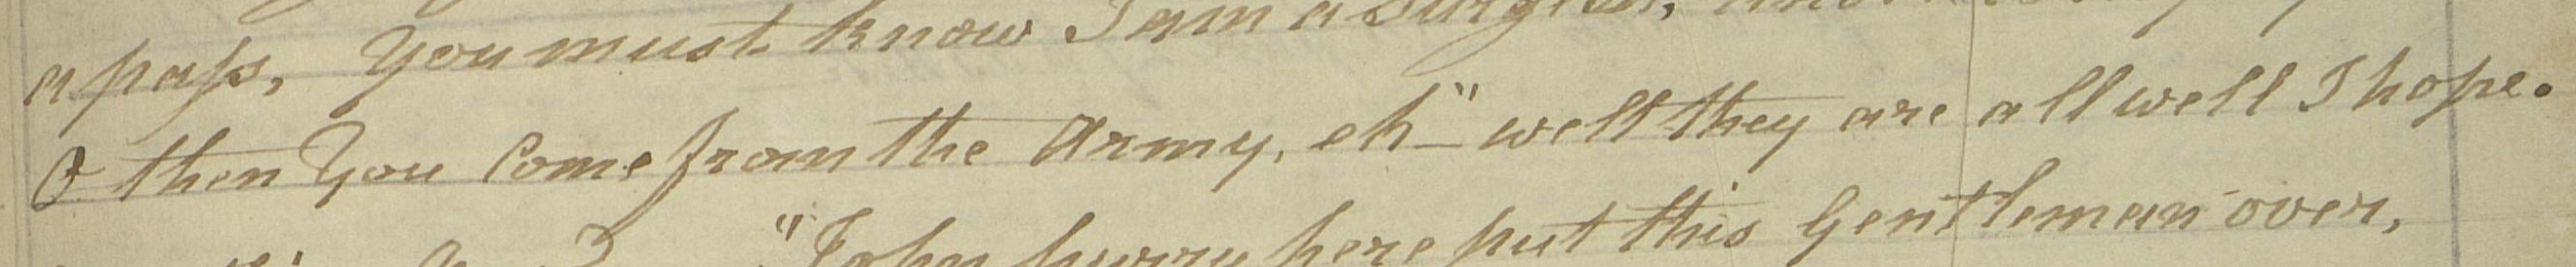O then You Come from the Army, eh" well they are all well I hope.
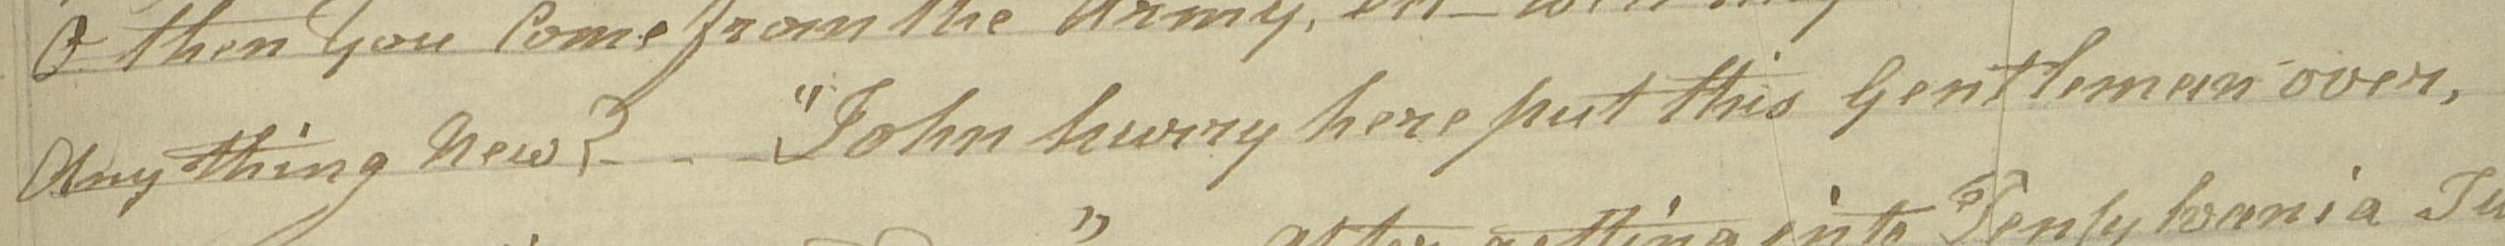Any thing new? "John hurry here put this Gentleman over,
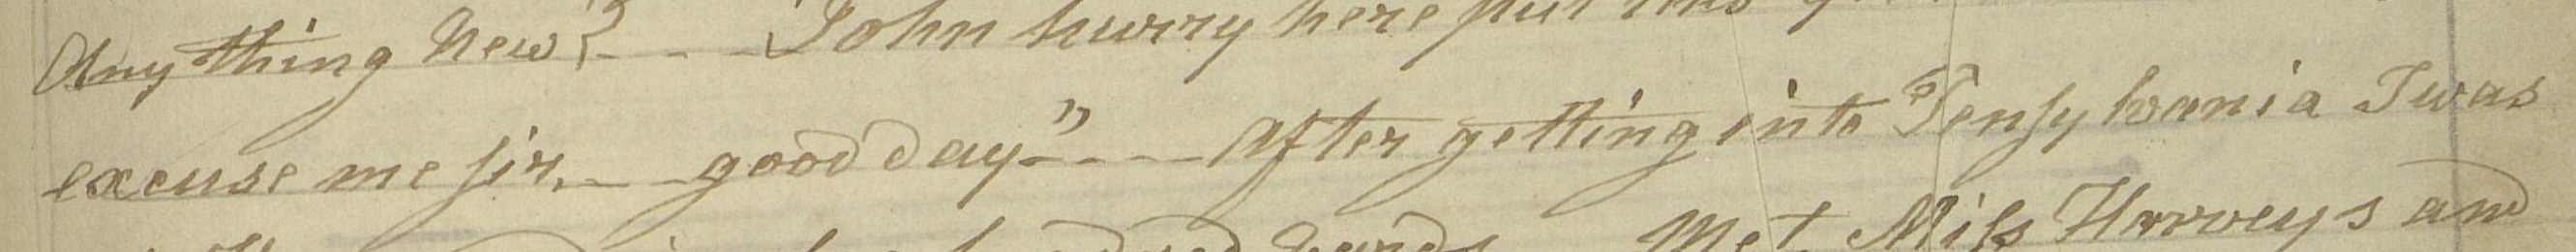excuse me sir, good day" after getting into Pennsylvania I was
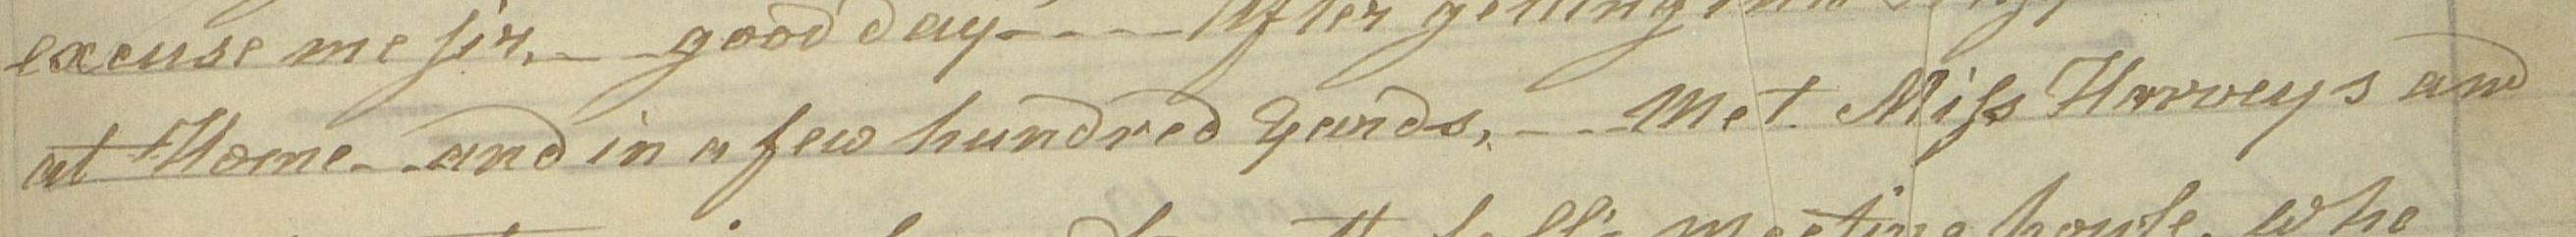at Home and in a few hundred yards, Met Miss Harveys and
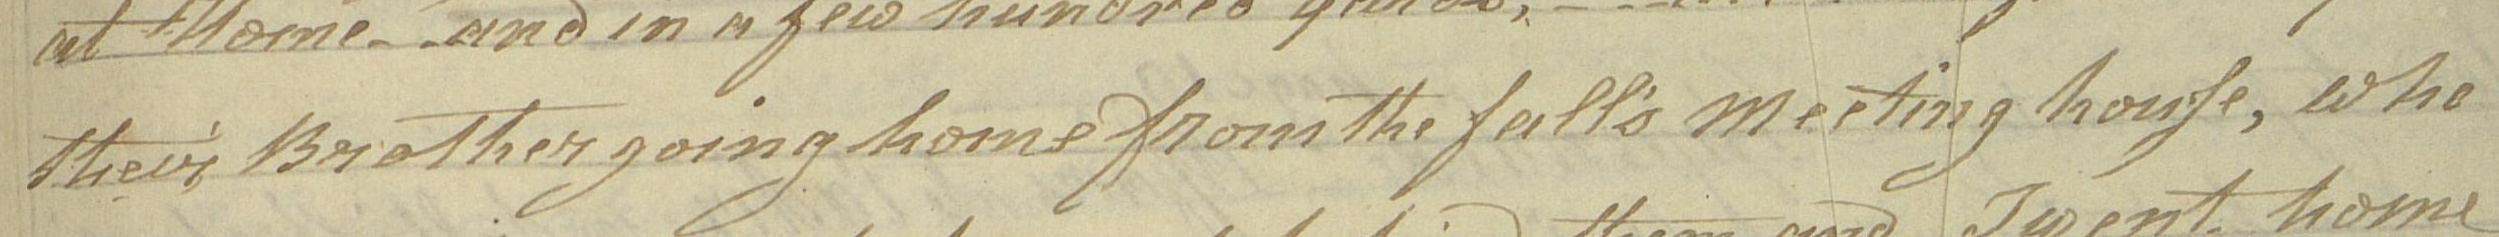their Brother going home from the fall's meeting house, who
